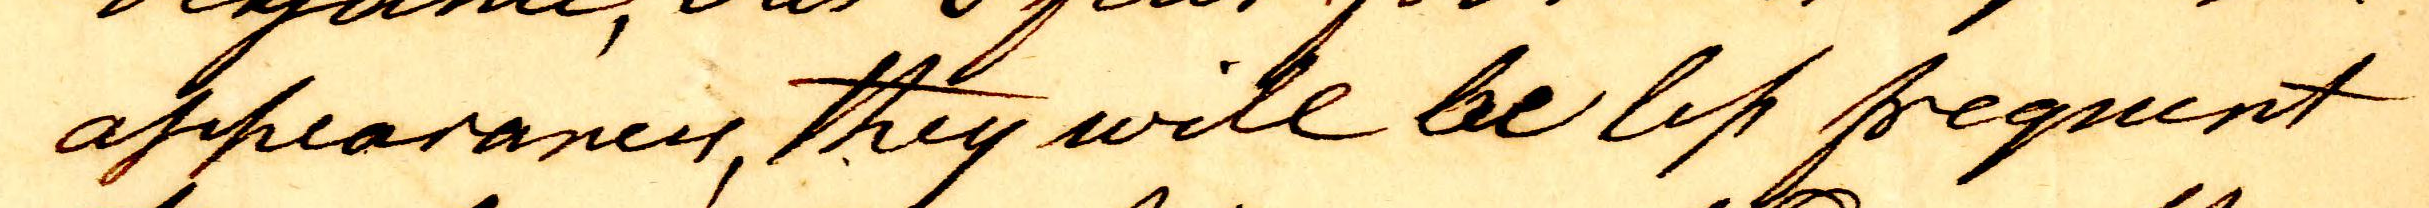appearances, they will be less frequent
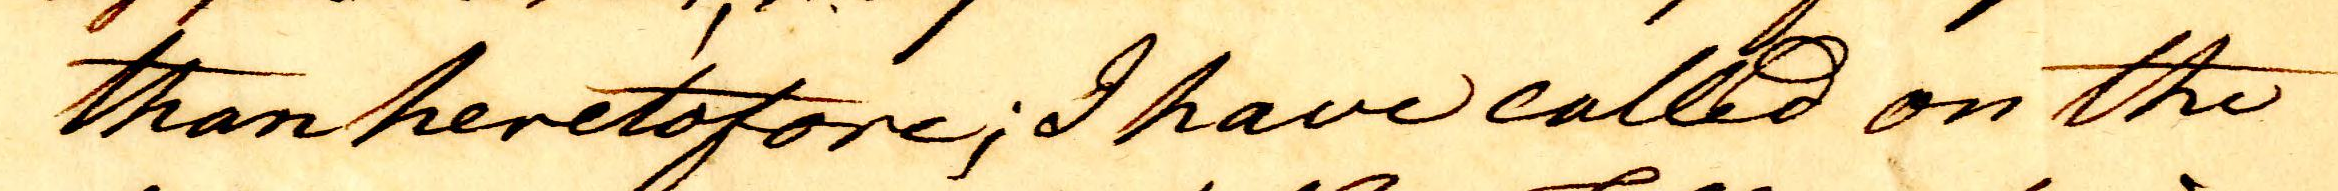than heretofore; I have called on the
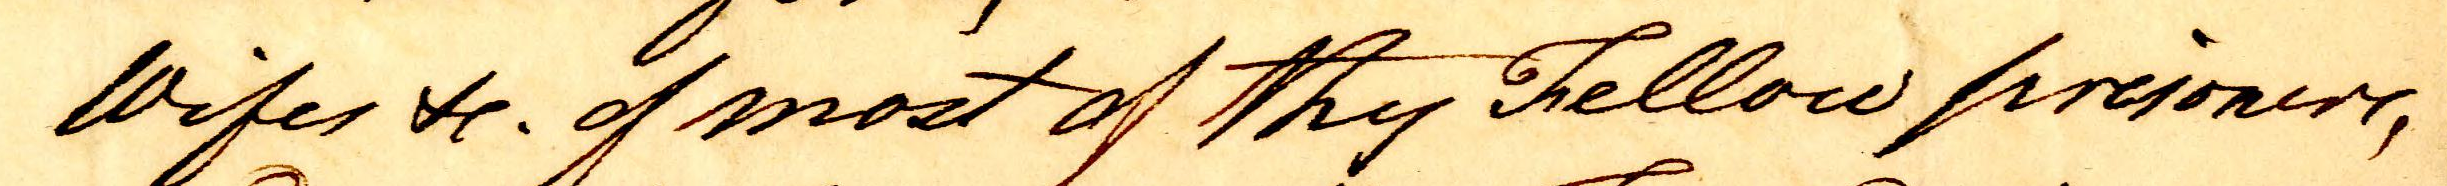Wifes &c. of most of thy Fellow prisoners,
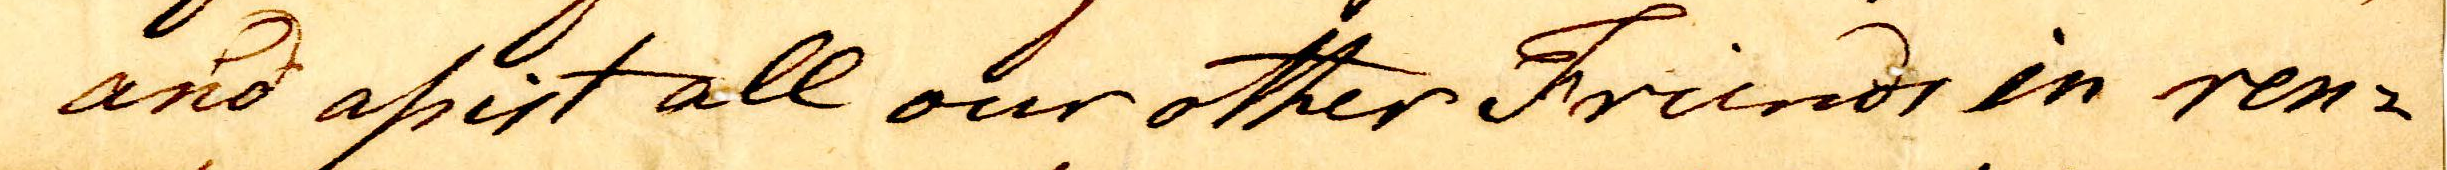and assist all our other Friends in ren-
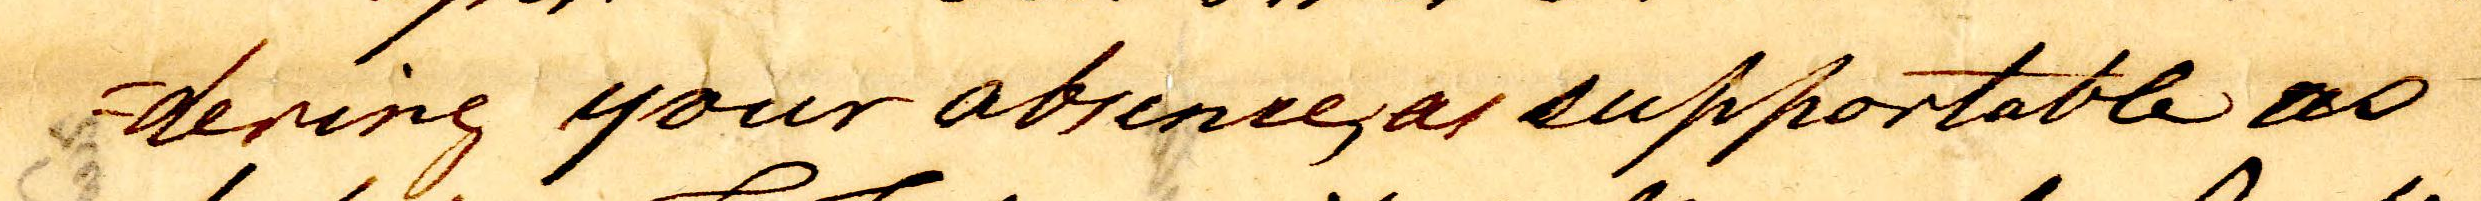-dering your absence, as supportable as
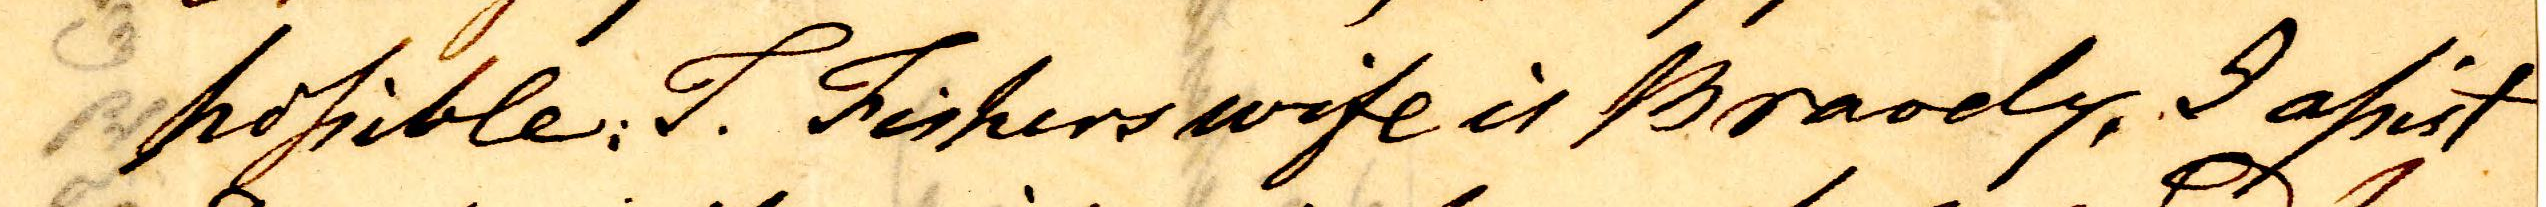possible. T. Fishers wife is Bravely. I assist
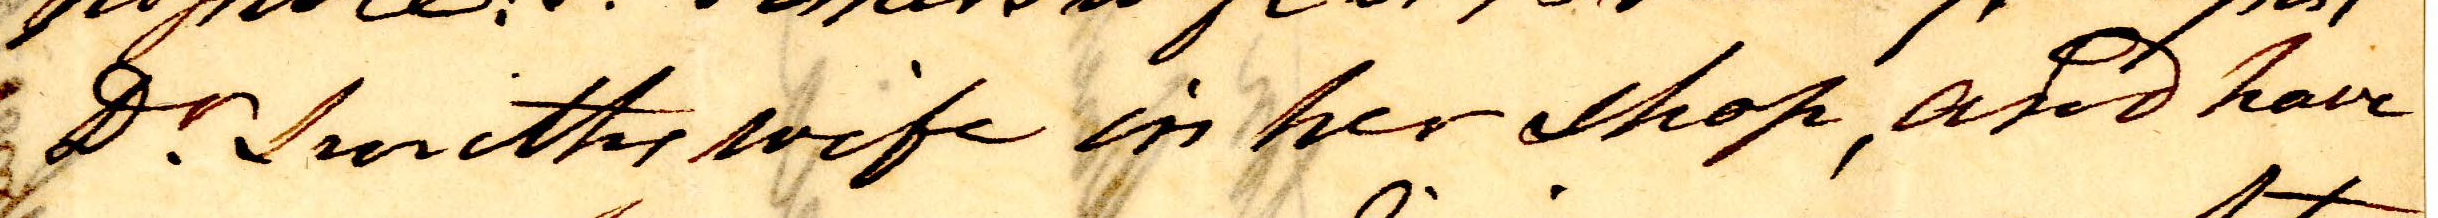D^r. Smiths wife in her shop, and have
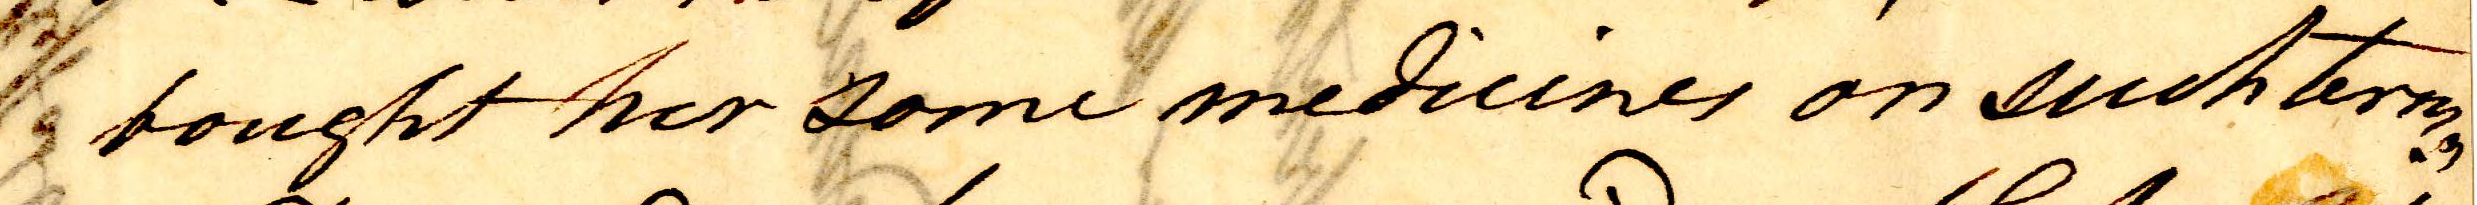bought her some medicines on such terms
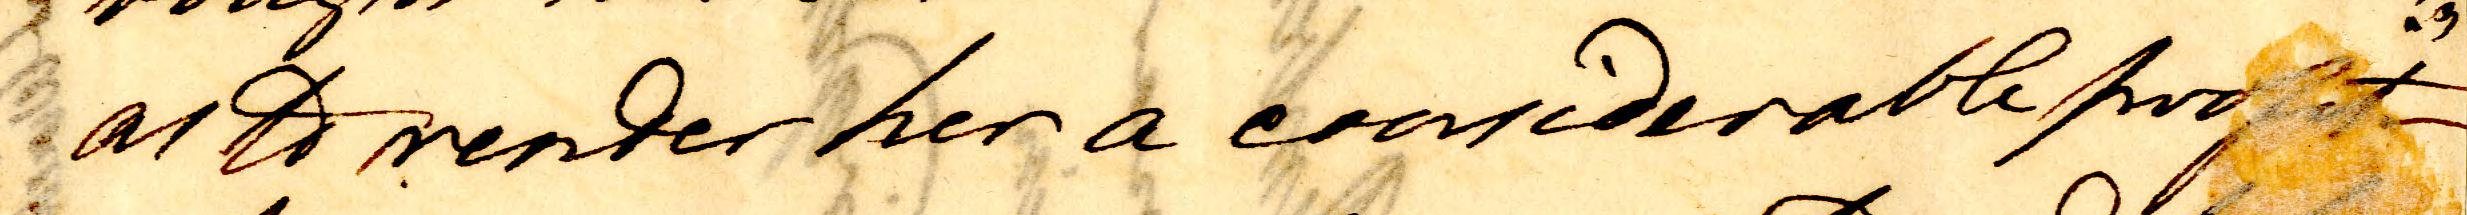as to render her a considerable profit-
